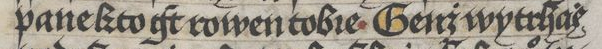pane kto ḡt rowen tobie.Genż wytrhaṡ
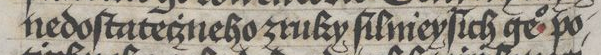nedoſtatecżneho zruky ſilnieyẛich ge° po¬
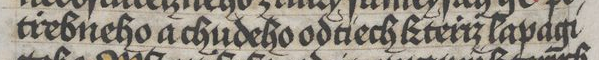tṙebneho a chudeho odtiech kteṙíż lapagí
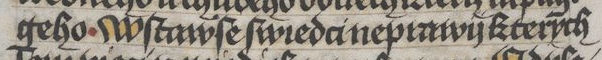geho.Wſtawẛe ſwiedci neprawij kterych
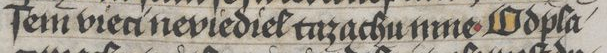ſem viecí neviediel tazachu mne.Odpla¬
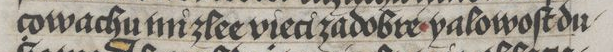cowachu mi zlee vieci zadobré.yalowoſt du¬
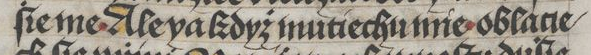ẛie me.Ale ya kdyż mutíechu mie.oblacie¬
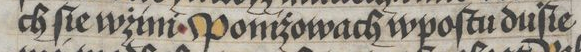ch ſie wżíni.Poniżowach wpoſtu duẛie
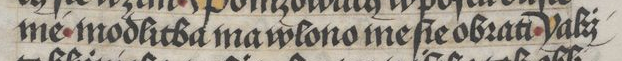mé.modlitba ma wlono meſie obrati.Yakż¬
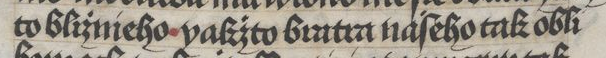to bliżníeho.yakżto bratra naẛeho tak obli
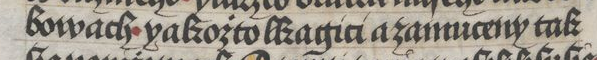bowach.yakożto lkagící a zamuceny tak
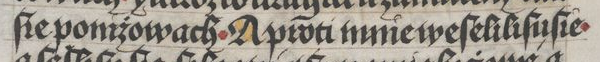ſie pomżowach.A proti mnie weſeliliſuſie.
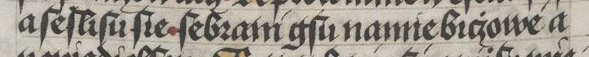a ſeẛliſu ſie.ſebraní gſu namie bicżowé a
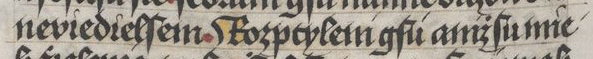neviedielſem. Rozptylení gſú aniż ſu mie¬
